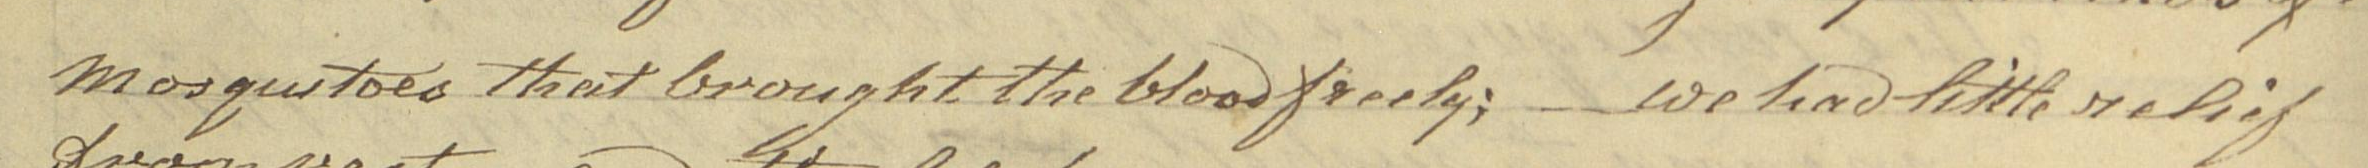mosquitoes that brought the blood freely; we find little relief
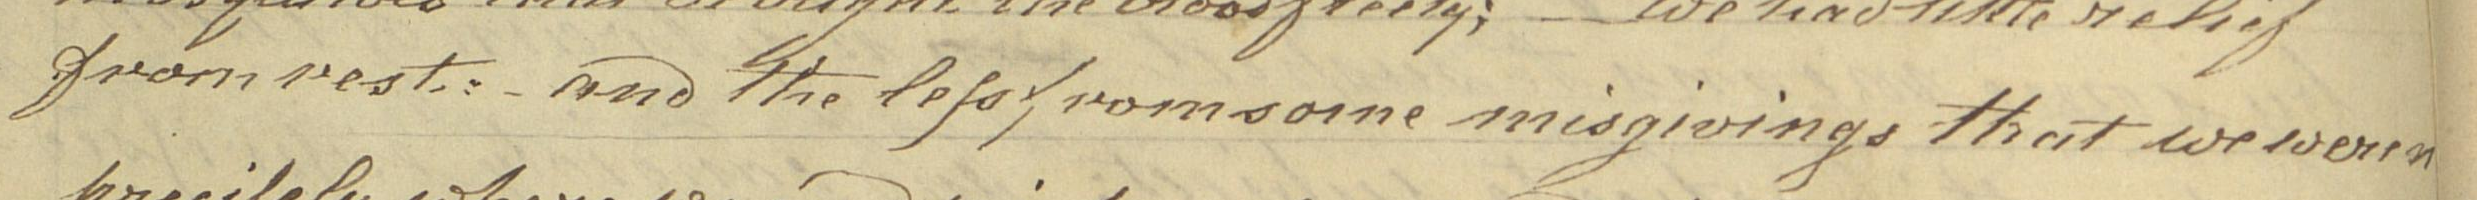from rest: and the less, from some misgivings that we were n-
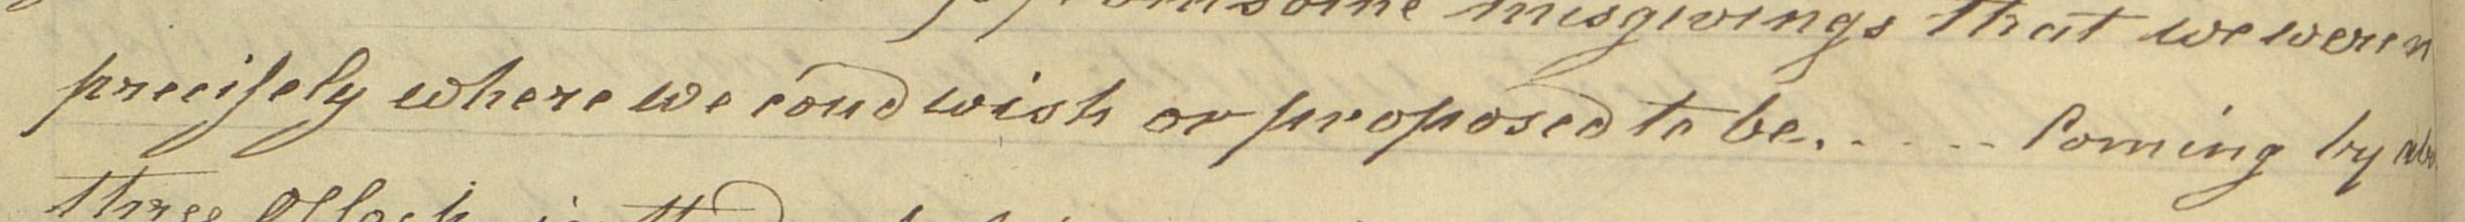precisely where we could wish or proposed to be. Coming by a-
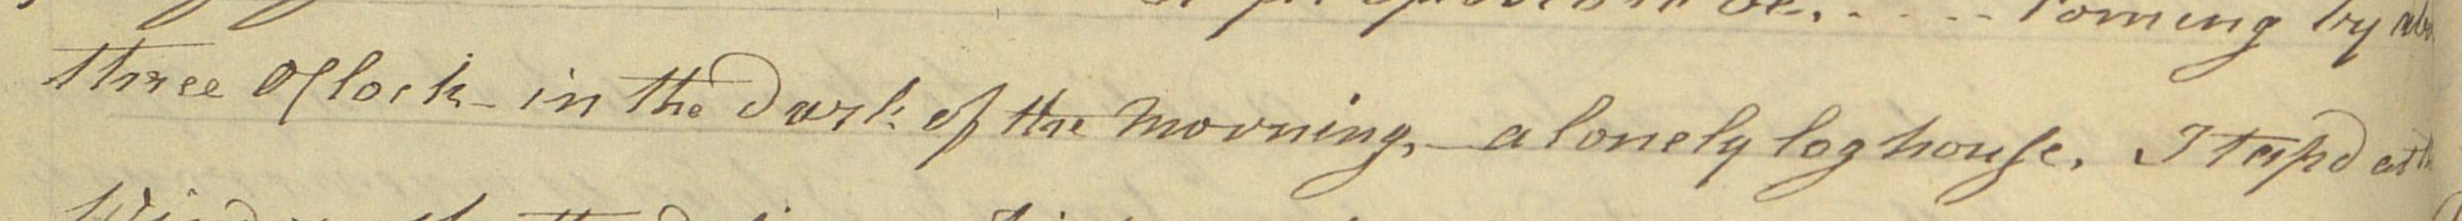three O Clock in the dark of the Morning, a lonely log house, I tapd at
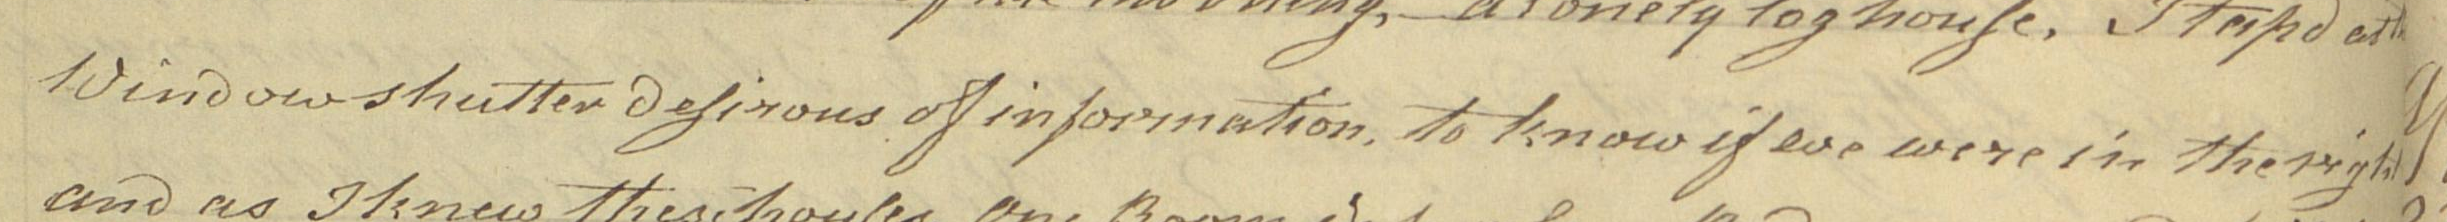Window shutter desirious of information, to know if we were in the right
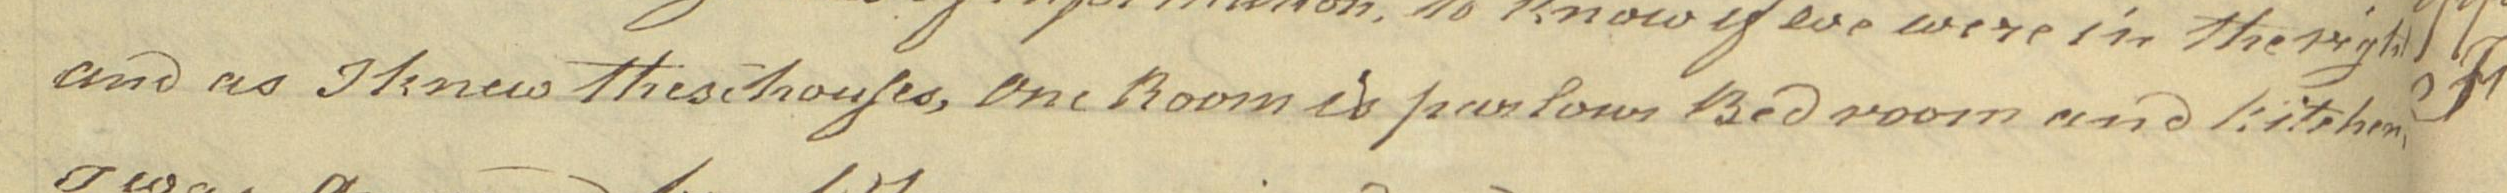and as I knew these houses, one Roomes parlour bed room and litehen
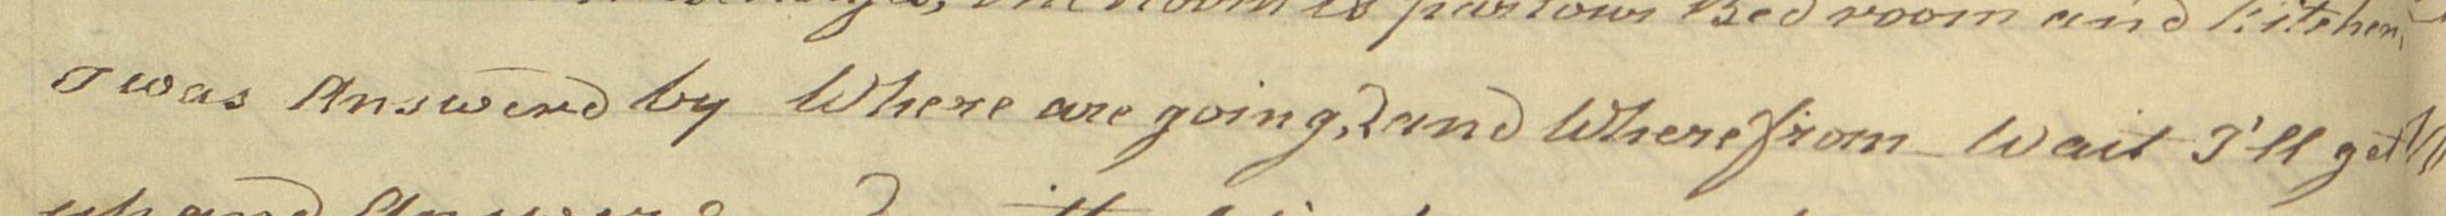I was answerd by Where are going? and where from Wait I'll get
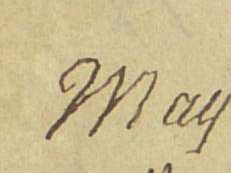May
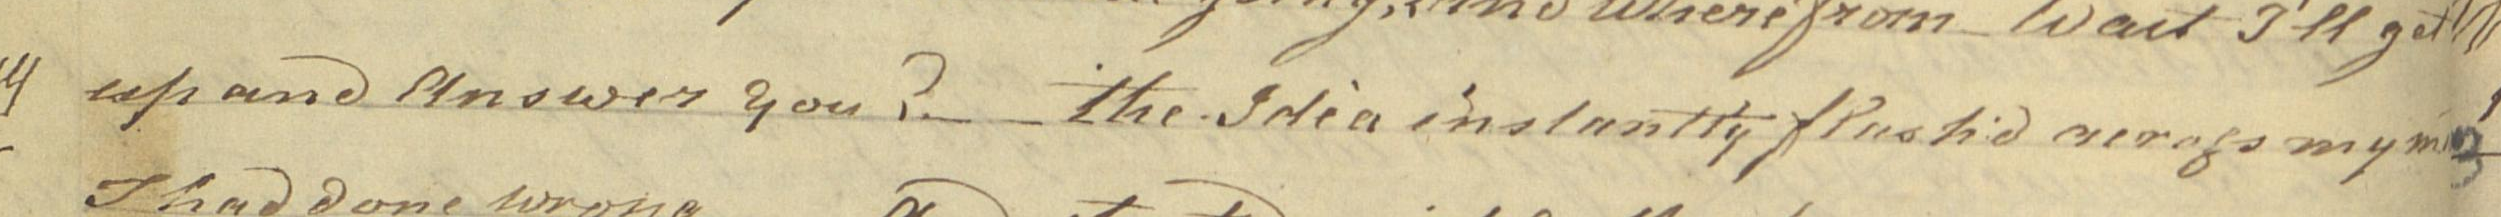up and answer you? The Idea instantly flush'd across my m-
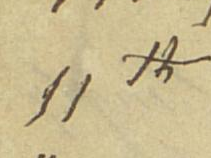11^th
